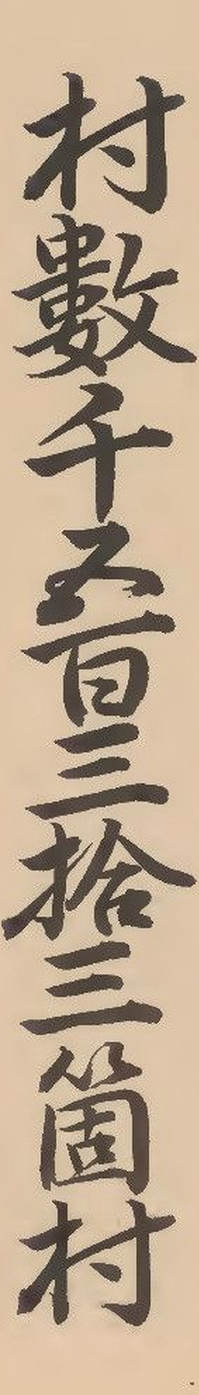村数千五百三拾三箇村
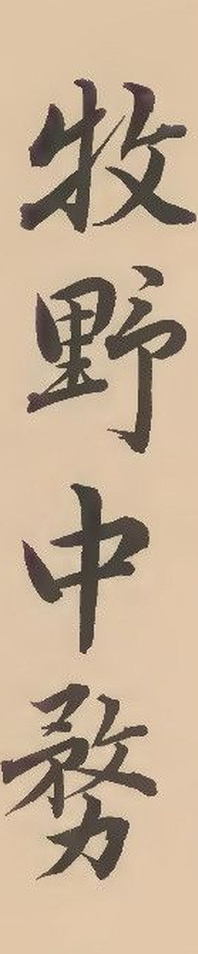牧野中務
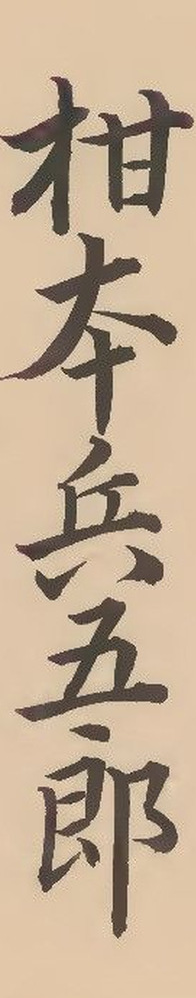柑本兵五郎
